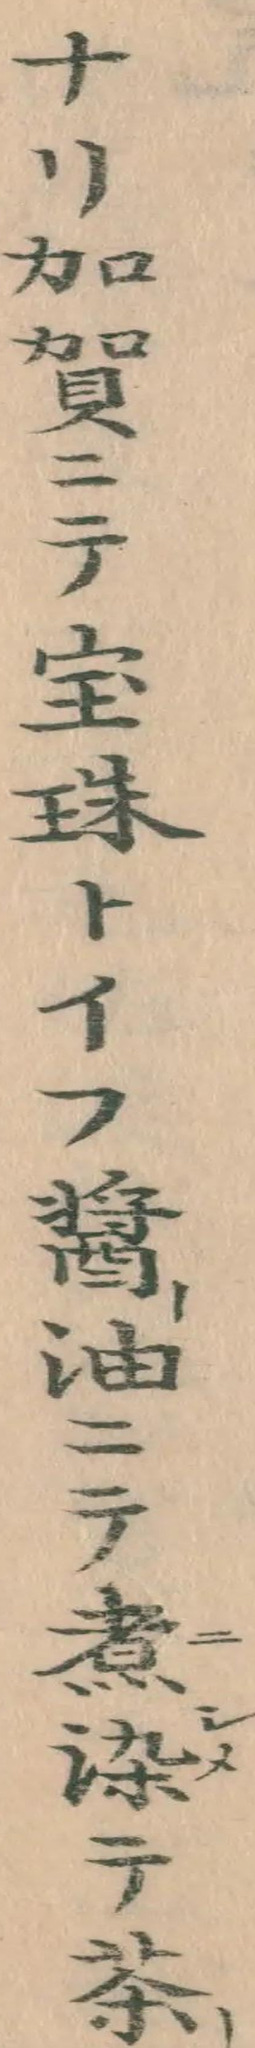ナリ加賀ニテ宝珠トイフ醤油ニテ煮染テ茶
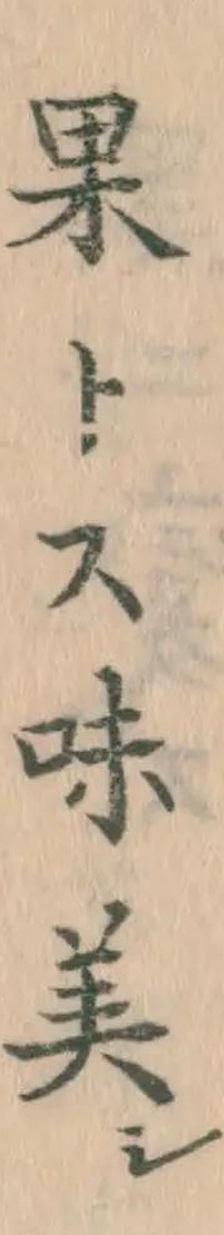果トス味美
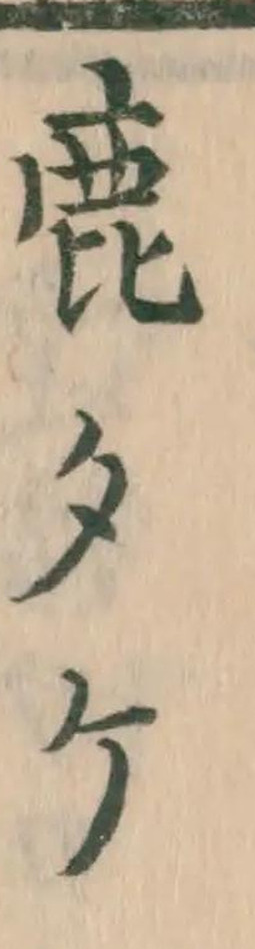鹿タケ
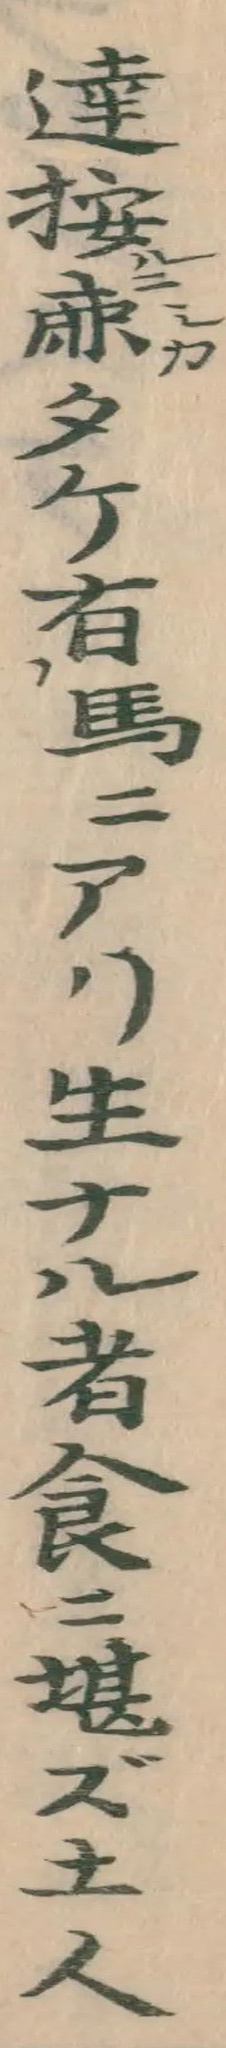達按鹿タケ有馬ニアリ生ナル者食ニ堪ズ土人
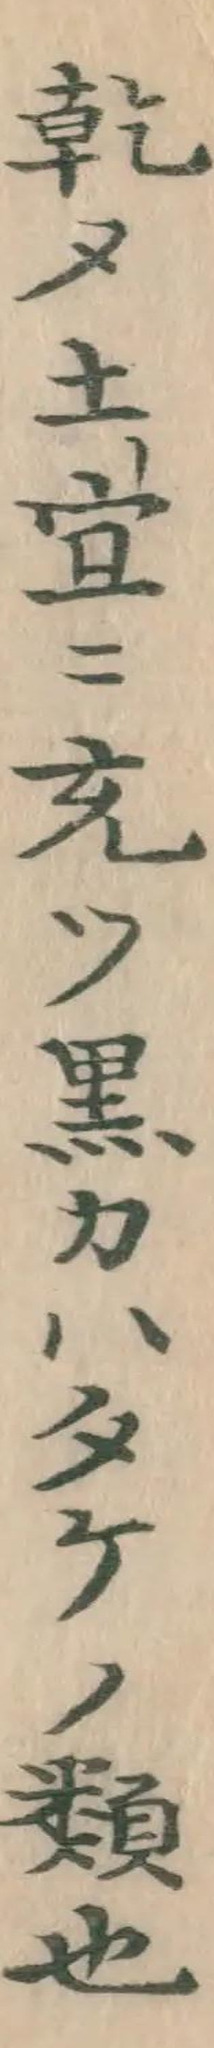乾シテ土宜ニ充ツ黒カハタケノ類也
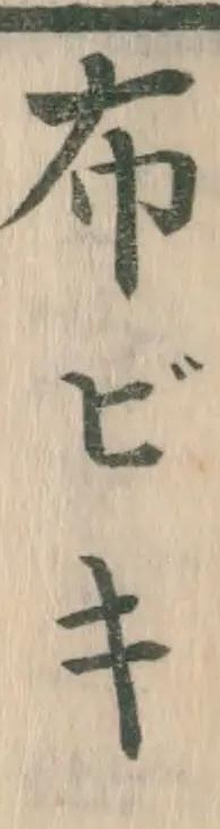布ビキ
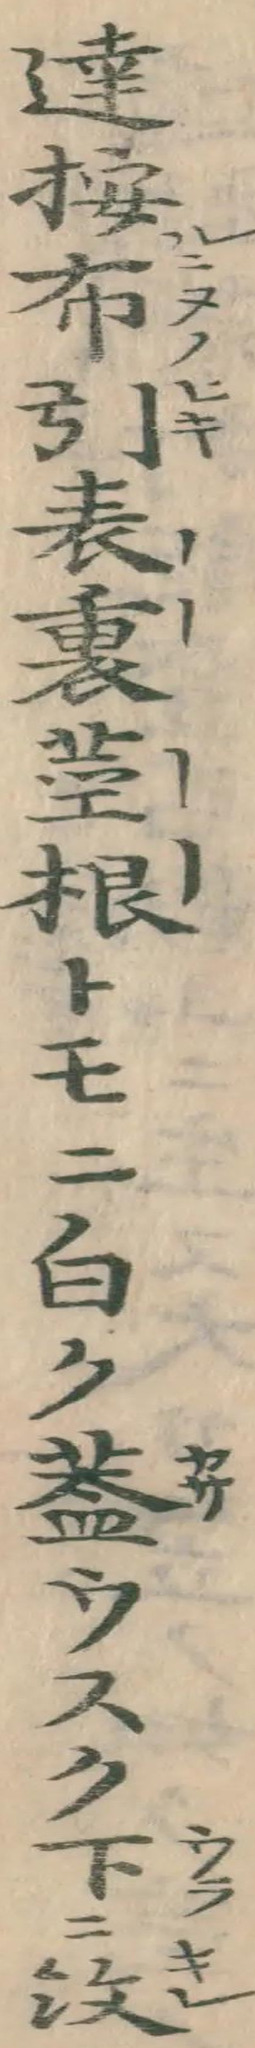達按布引表裏茎根トモニ白ク葢ウスク下ニ紋
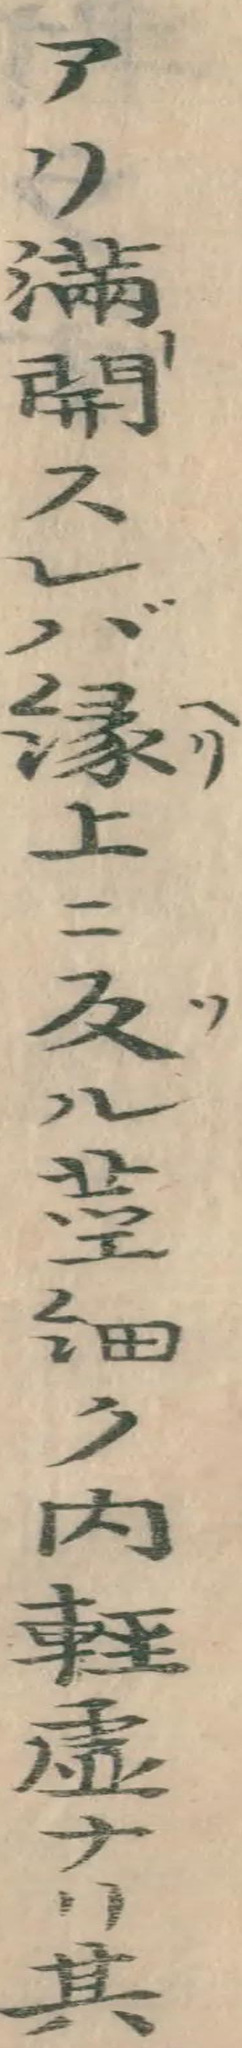アリ満開スレバ縁上ニ反ル茎細ク内軽虚ナリ其
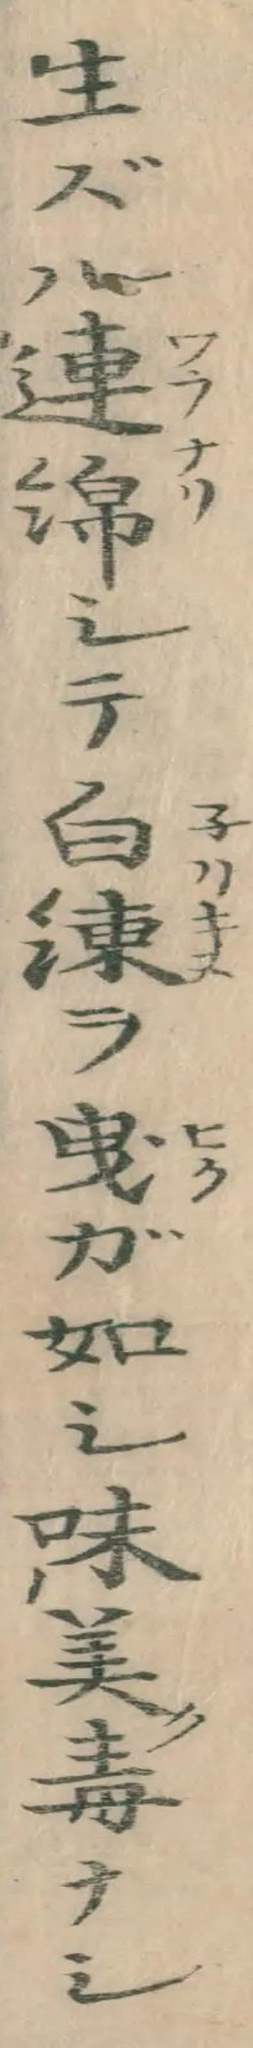生ズル連綿シテ白練ヲ曳ガ如シ味美ク毒ナシ

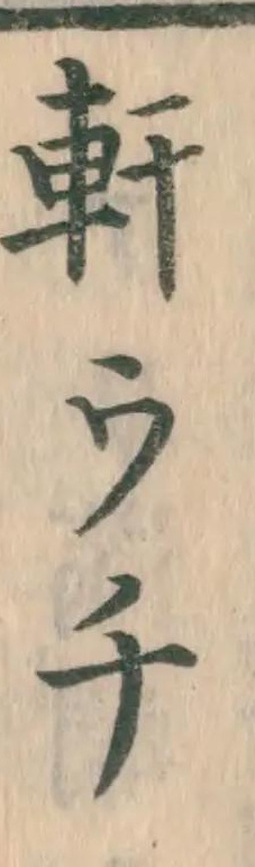軒ウチ
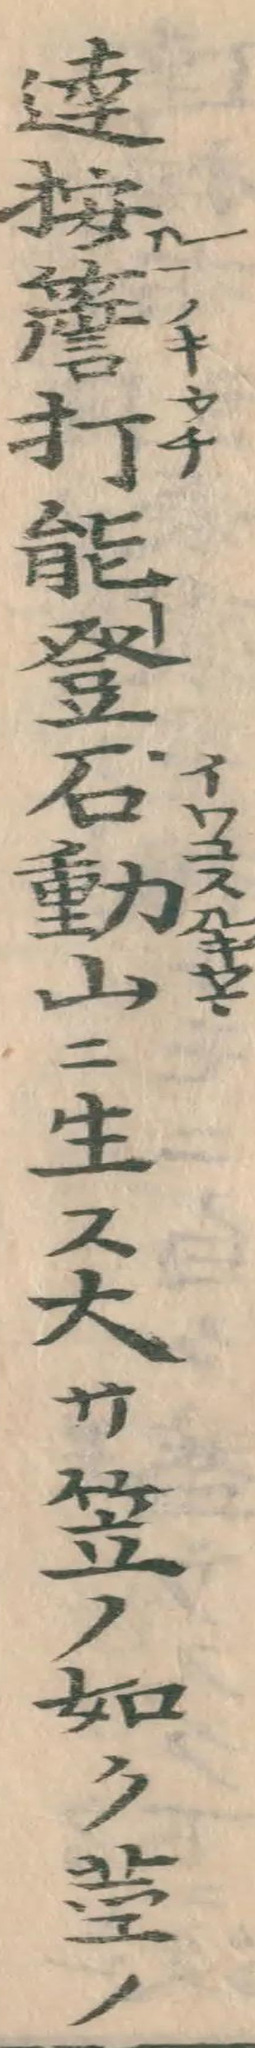達按簷打能登岩動山ニ生ス大サ笠ノ如ク茎ノ
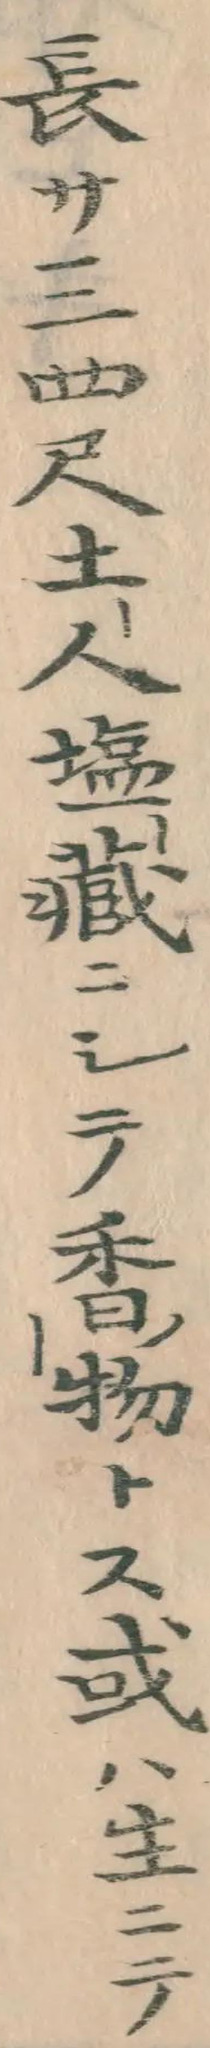長サ三四尺土人塩蔵ニシテ香物トス或ハ生ニテ
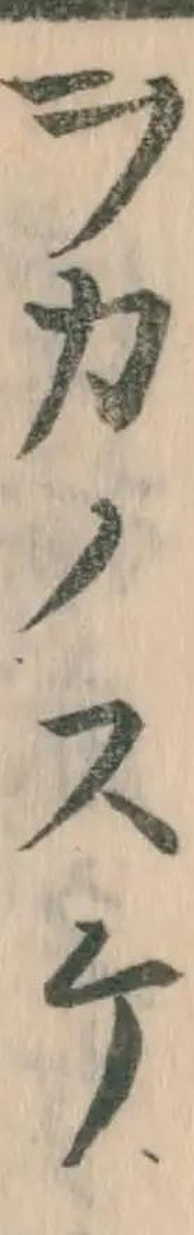ヲカノスケ
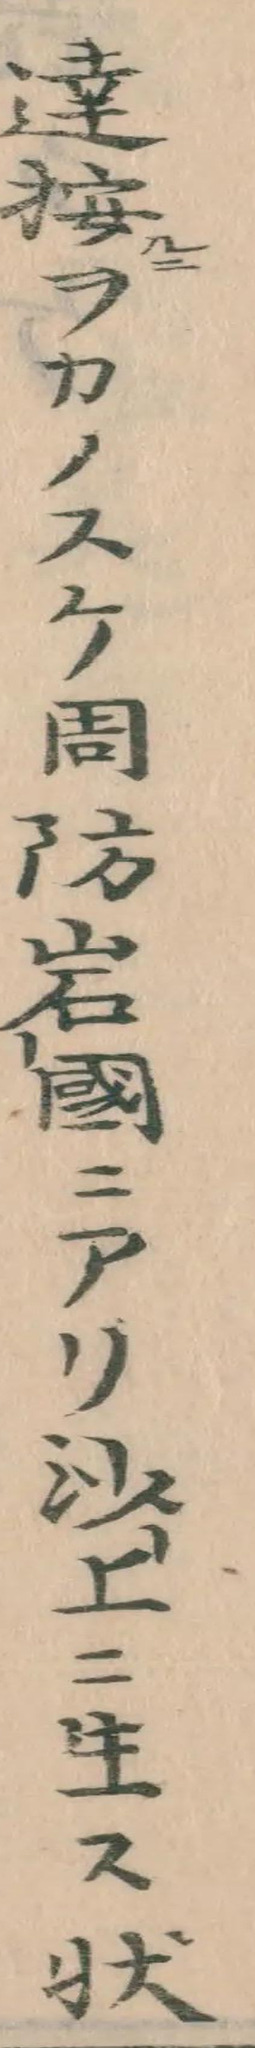達按ヲカノスケ周防岩国ニアリ沙上ニ生ス状
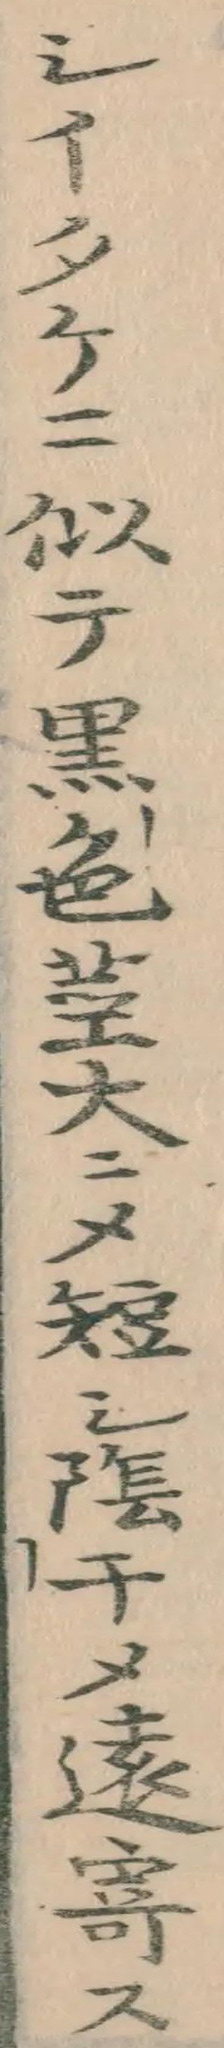シイタケニ似テ黒色茎大ニシテ短シ陰干シテ遠寄ス
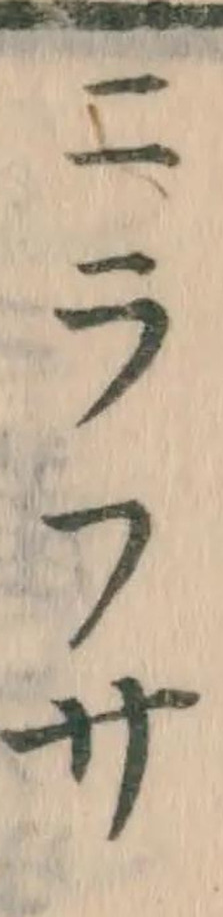ニラフサ
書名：怡顔斎菌品 2巻
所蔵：国立国会図書館 National Diet Library, JAPAN
